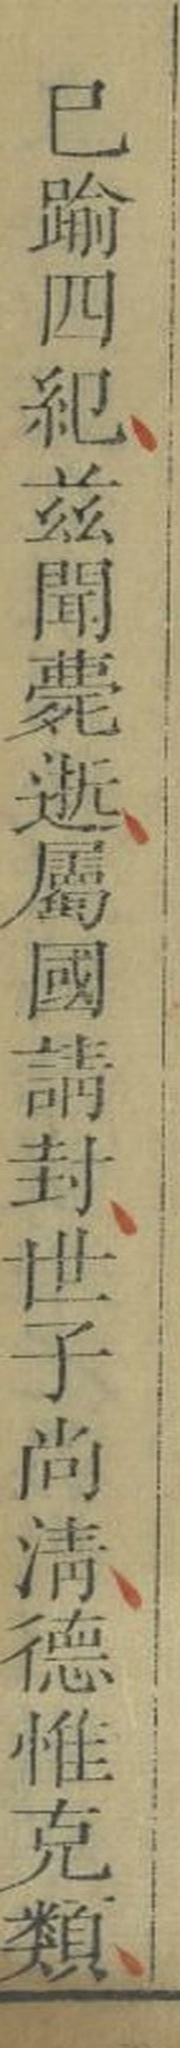巳踰四紀茲聞薨逝属国請封世子尚清徳惟克類

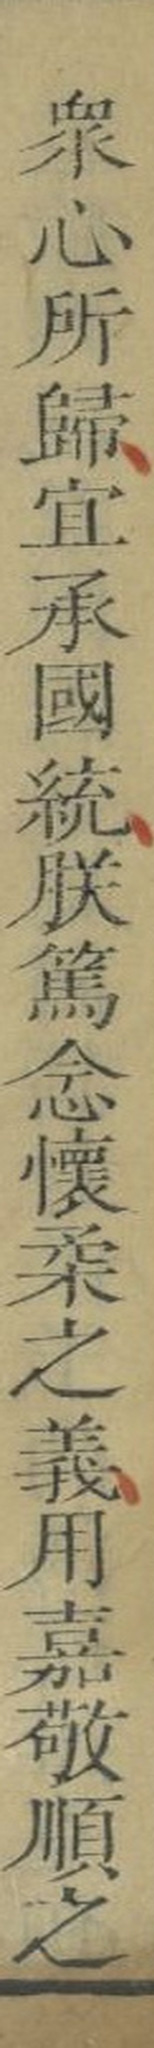衆心所帰宜承国統朕篤念懐柔之義用嘉敬順之
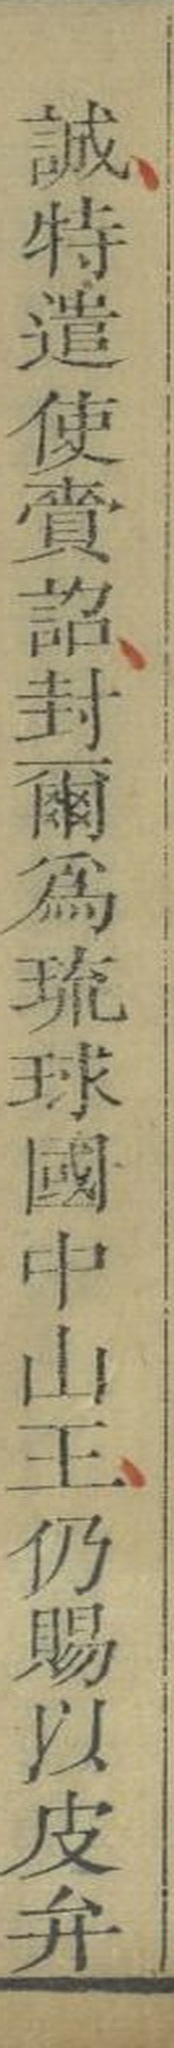誠特遣使賚詔封爾為琉球国中山王仍賜以皮弁
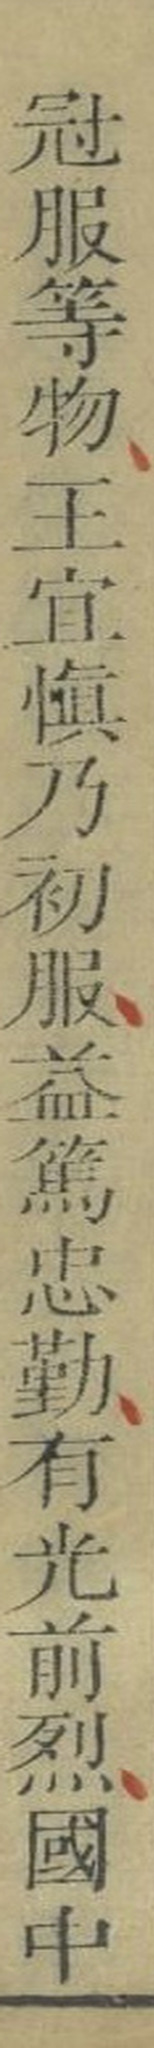冠服等物王宜慎乃初服益篤忠勤有光前烈国中
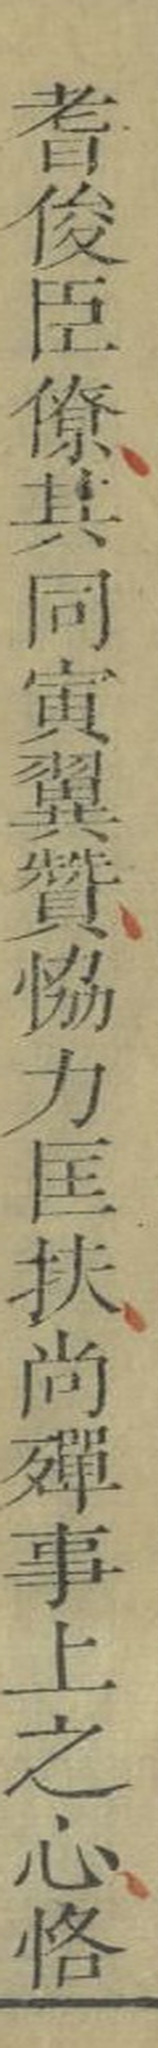耆俊臣僚其同寅翼賛恊力匡扶尚殫事上之心恪
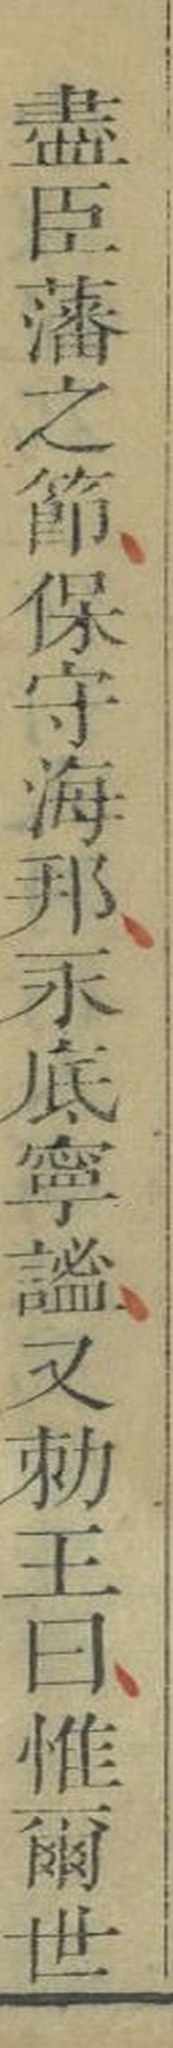尽臣藩之節保守海邦永底寧謐又勅王曰惟爾世
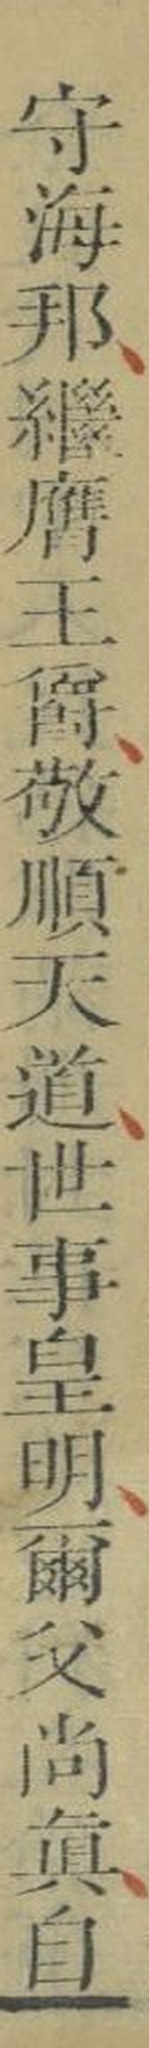守海邦継膺王爵敬順天道世事皇明爾父尚真自
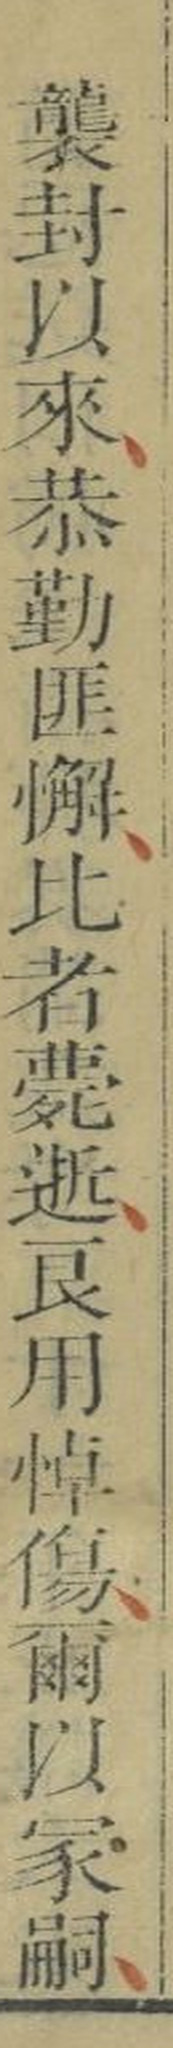襲封以来恭勤匪懈比者薨逝良用悼傷爾以冢嗣
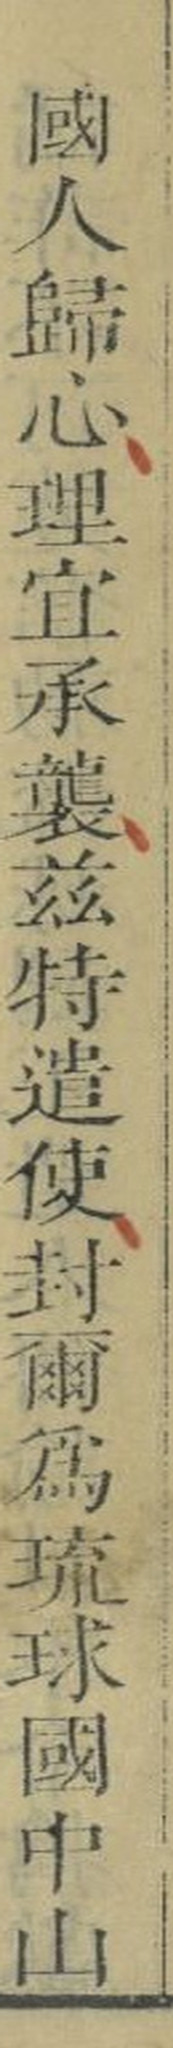国人帰心理宜承襲茲特遣使封爾為琉球国中山
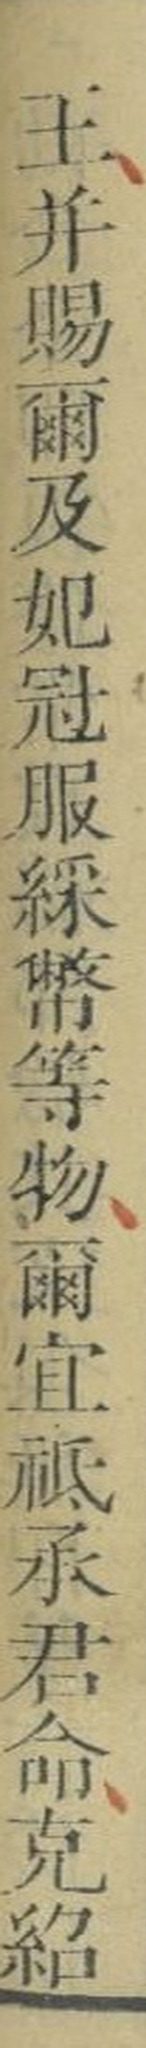王并賜爾及妃冠服綵幣等物爾宜祇承君命克紹
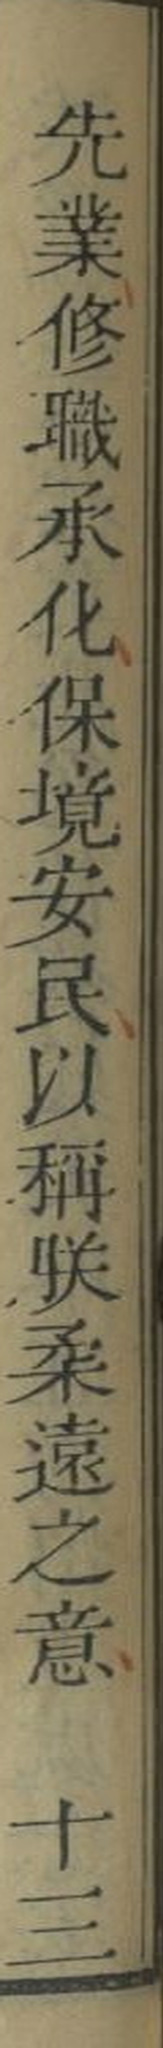先業修職承化保境安民以称朕柔遠之意十三
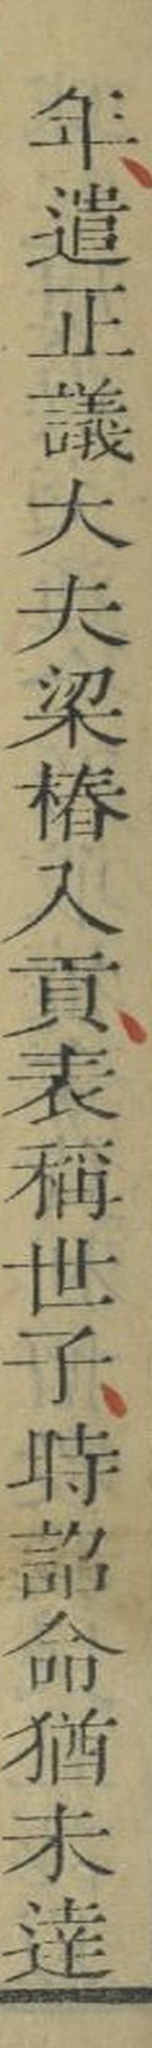年遣正議大夫梁椿入貢表称世子時詔命猶未達
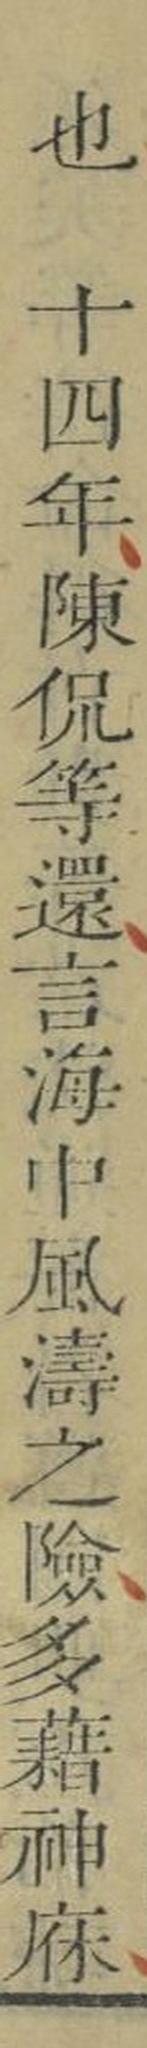也十四年陳侃等還言海中風濤之険多藉神庥
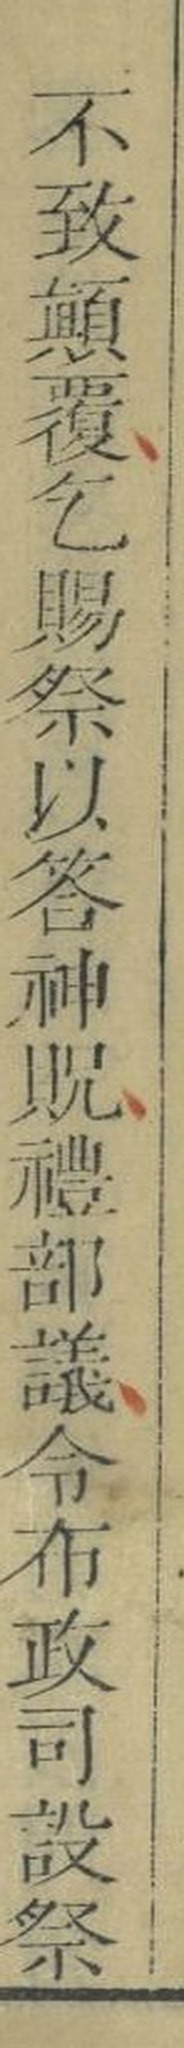不致顚覆乞賜祭以答神貺礼部議令布政司設祭
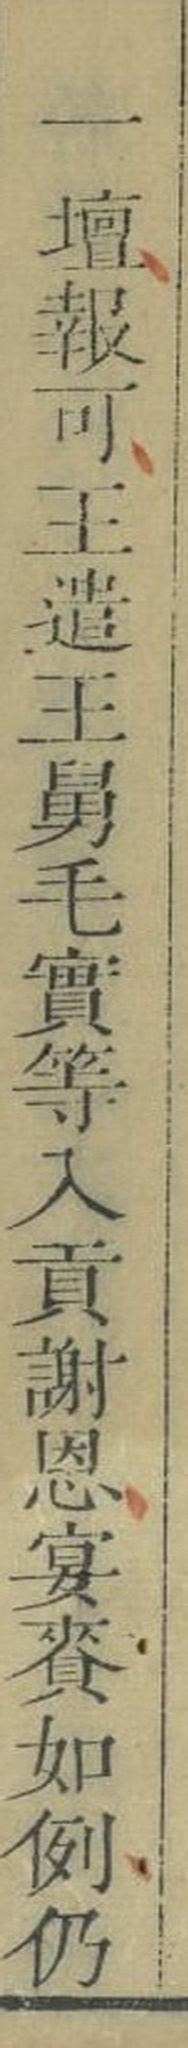一壇報可王遣王舅毛実等入貢謝恩宴賚如例仍
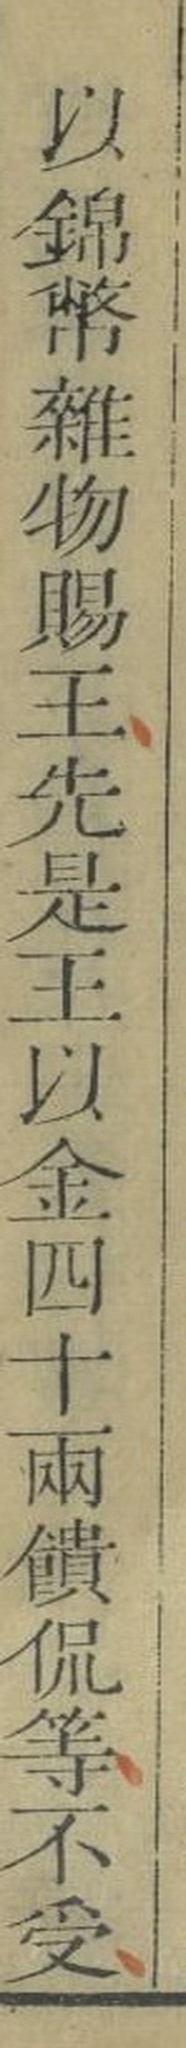以錦幣雑物賜王先是王以金四十両饋侃等不受
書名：中山伝信録 巻三
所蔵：University of the Ryukyus Library
